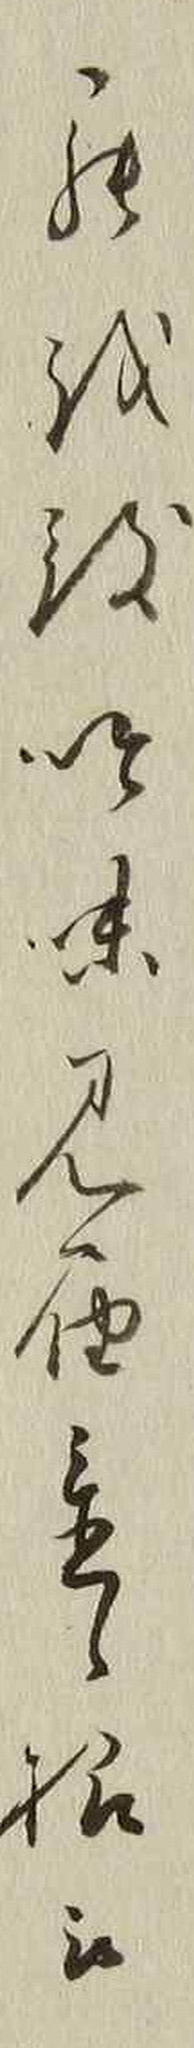罷越致吟味見届置候様被
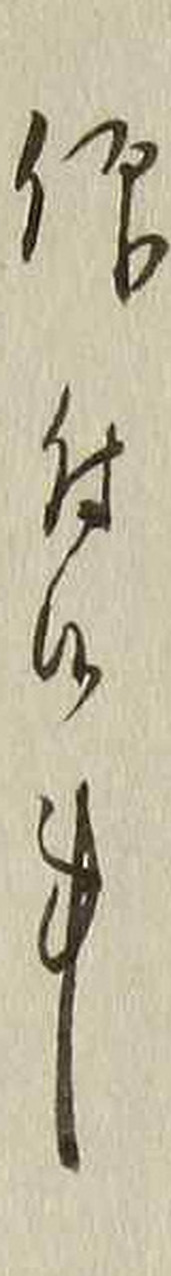仰付候事
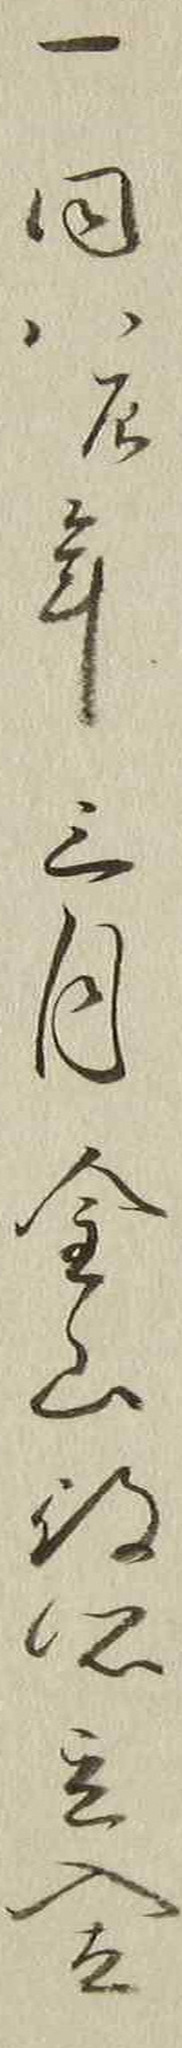一同八辰年三月金山役所立人立
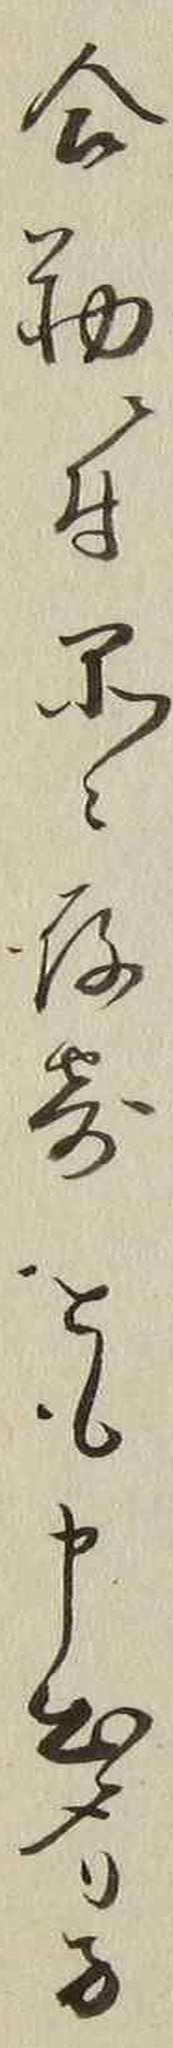合勤ニ付品々存寄をも申出〆り方
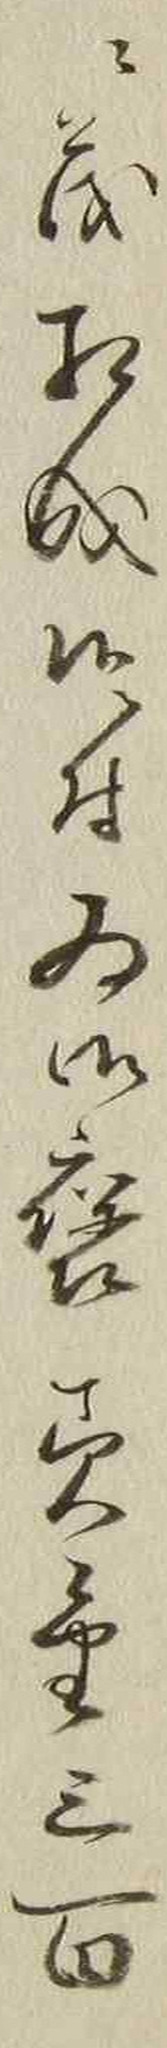ニ茂相成候ニ付為御褒美金三百
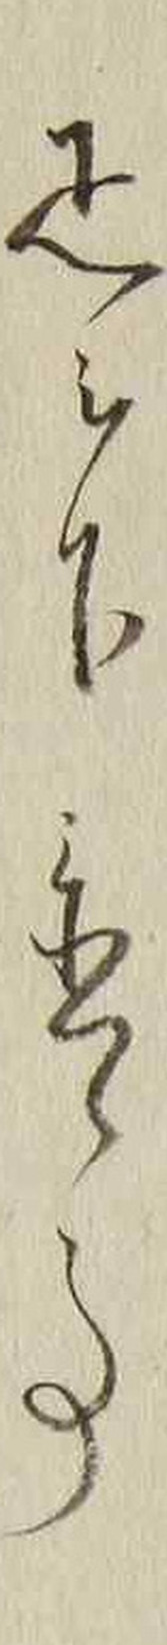疋被下置候事
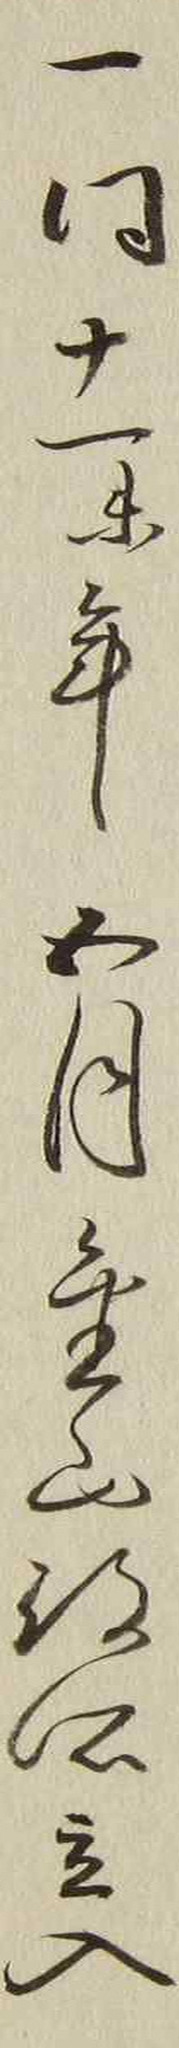一同十一未年五月金山役所立人
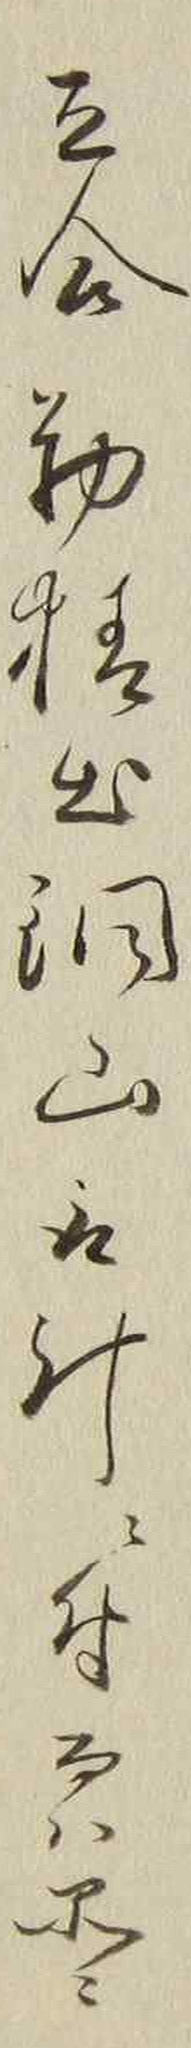立合勤精出銅山取計ニ付而ハ品々

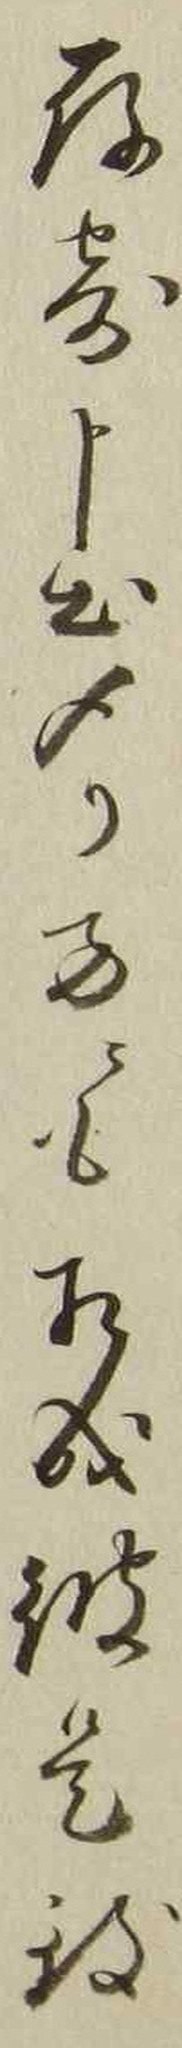存寄申出〆り方ニも相成彼是致
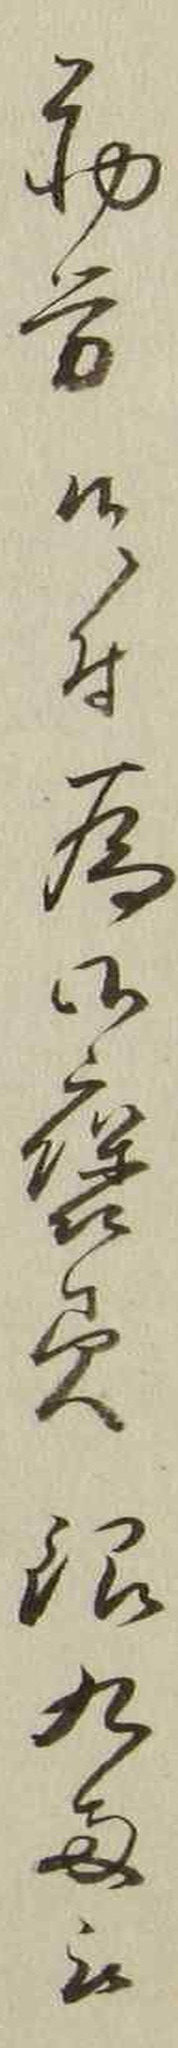勤労候ニ付為御褒美銀九両被
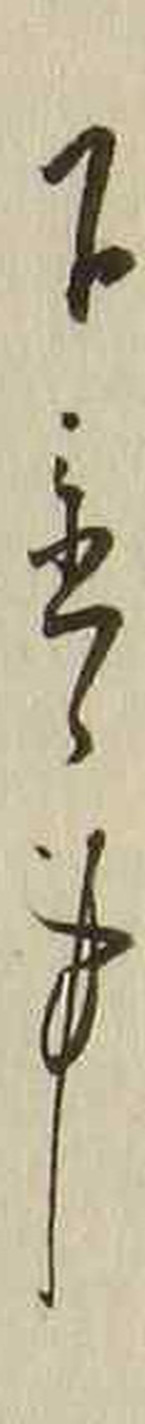下置候事
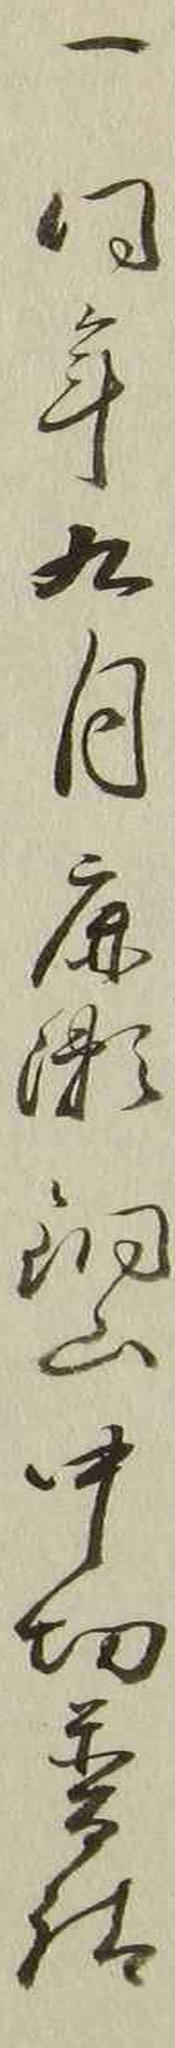一同年九月鹿瀬銅山中切普請
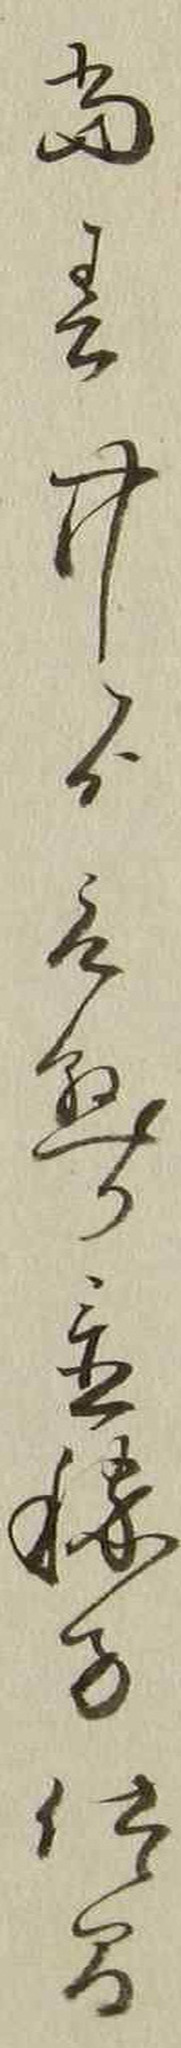当春中ゟ取懸り置稼方仕候間
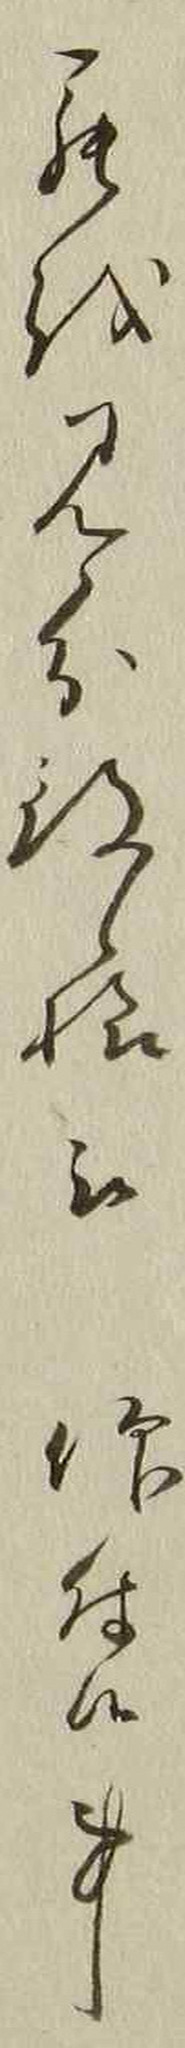罷越見分致候様被仰付候事
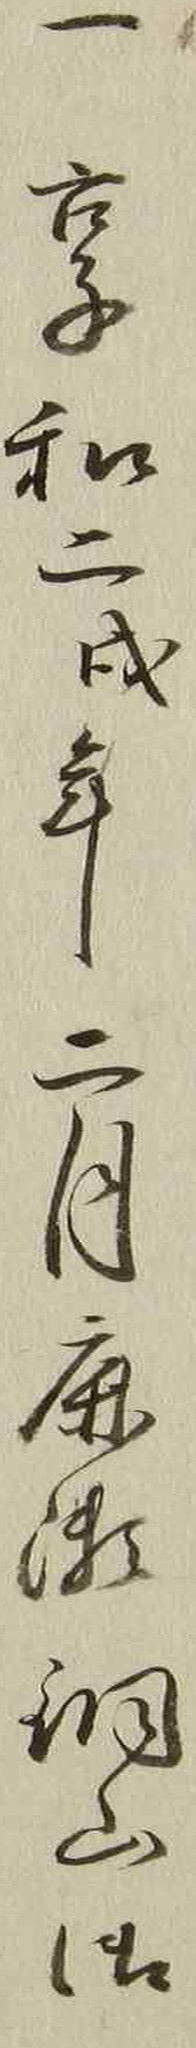一享和二戌年二月鹿瀬銅山御
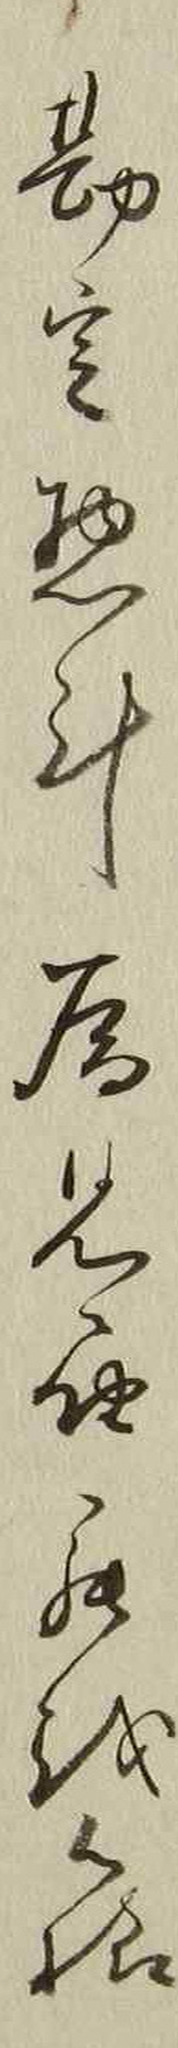勘定惣計為見届罷越候様
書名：諸士系譜　巻之52　に之部3
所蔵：会津若松市立会津図書館
